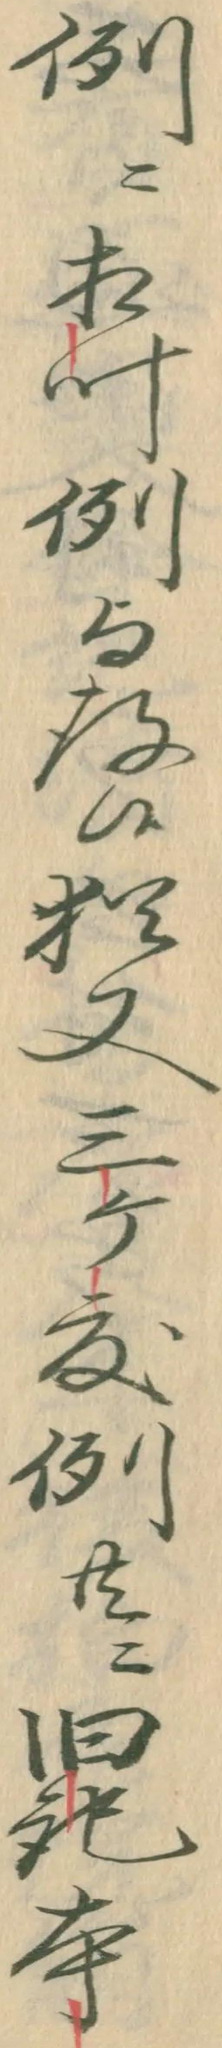例ニ相_叶例与存候猶又三-ケ-度例共ニ旧-記本-

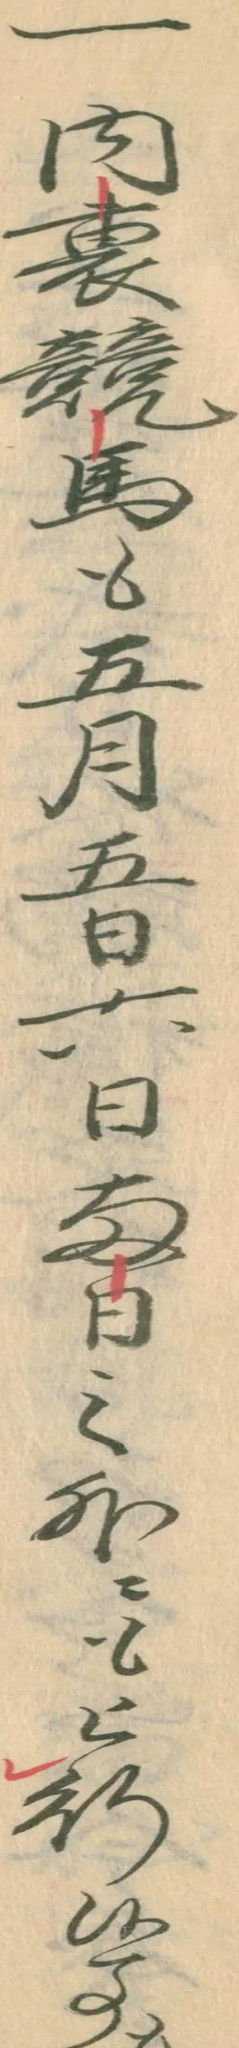一内-裏競-馬も五月五日六日両-日之外ニも被行候事も
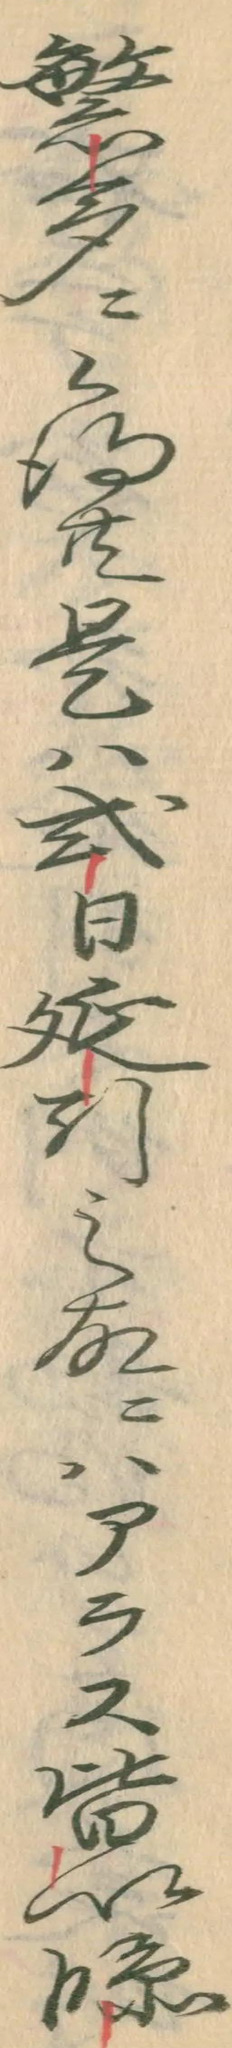繁-多ニ候得共是ハ式-日延-引之故ニハアラス皆_以臨-
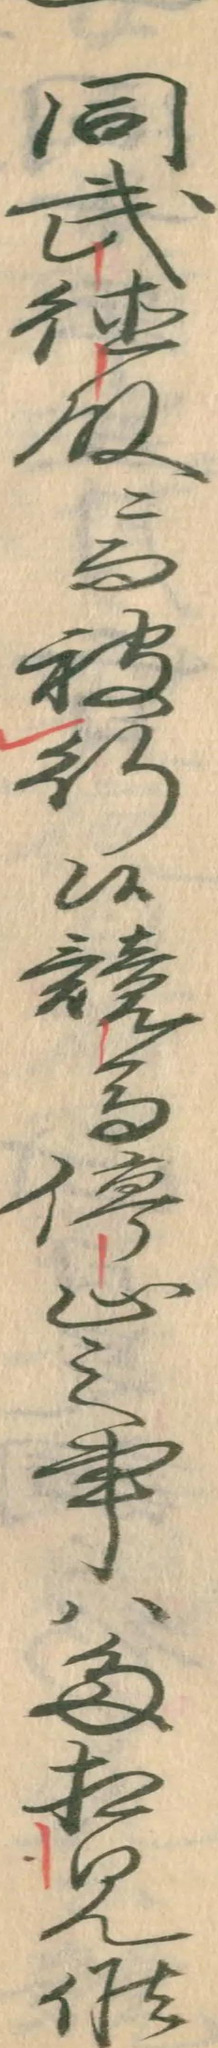一同武-徳-殿ニ而被行候競-馬停-止之事ハ多相_見候
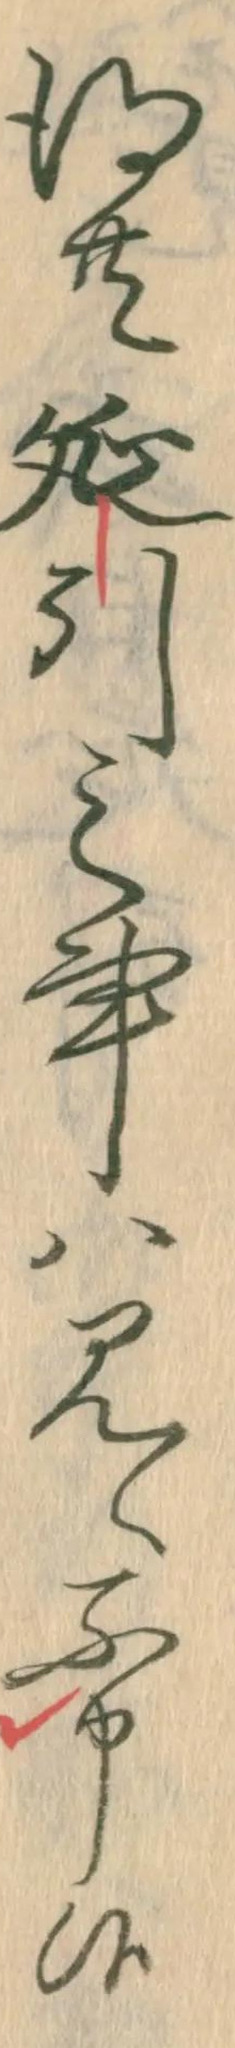得共延-引之事ハ見へ不申候
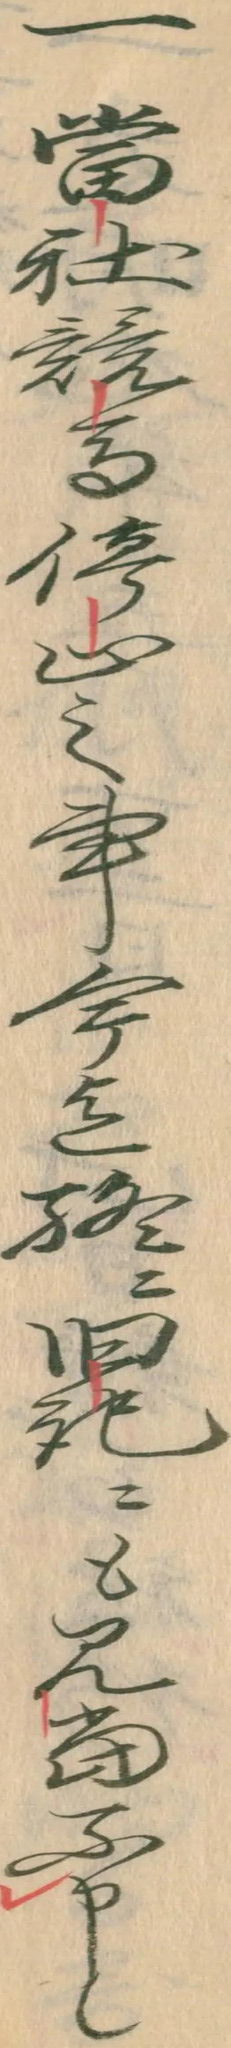一当-社競-馬停-止之事今迄終ニ旧-記ニも見_当不申候
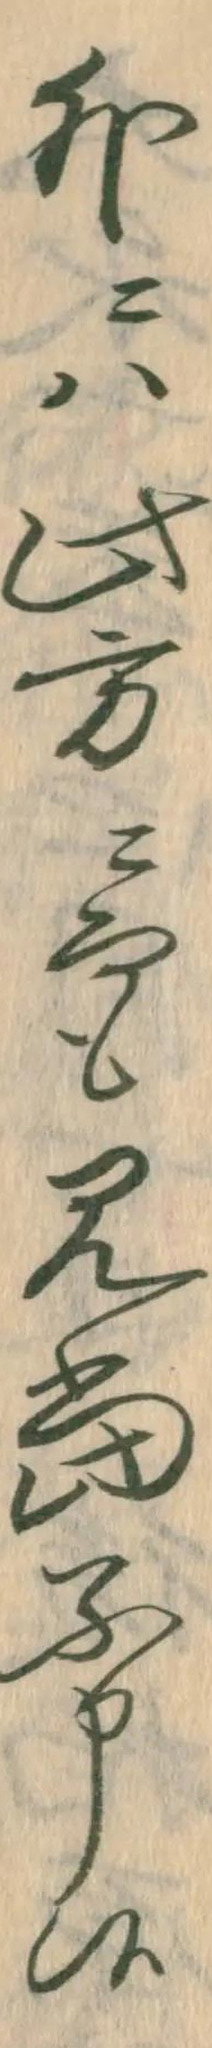外ニハ此方ニ而も見当不申候
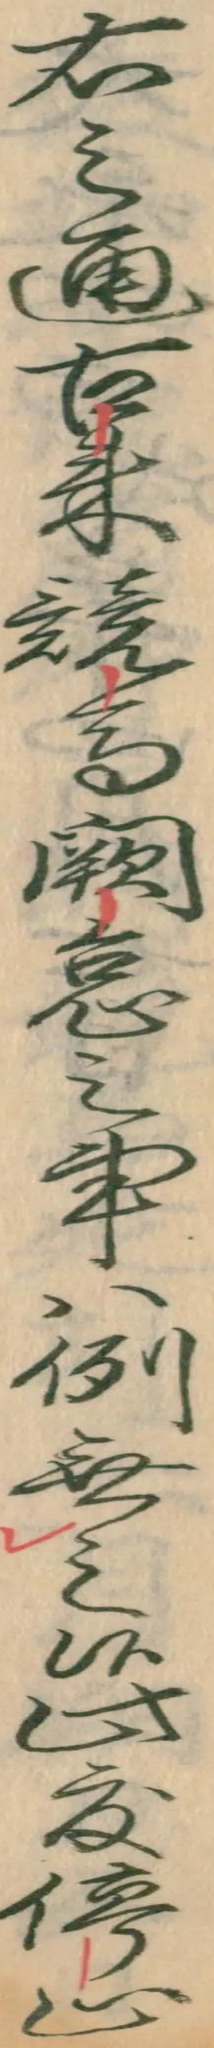右之通古-来競-馬闕-怠之事ハ例無之候此度停-止
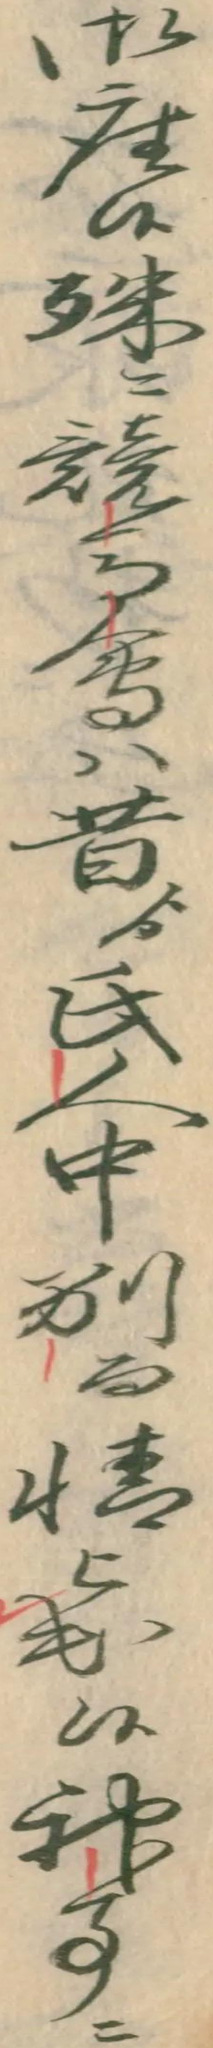御座候殊ニ競-馬-会ハ昔ゟ氏中別_而情被出候神-事ニ
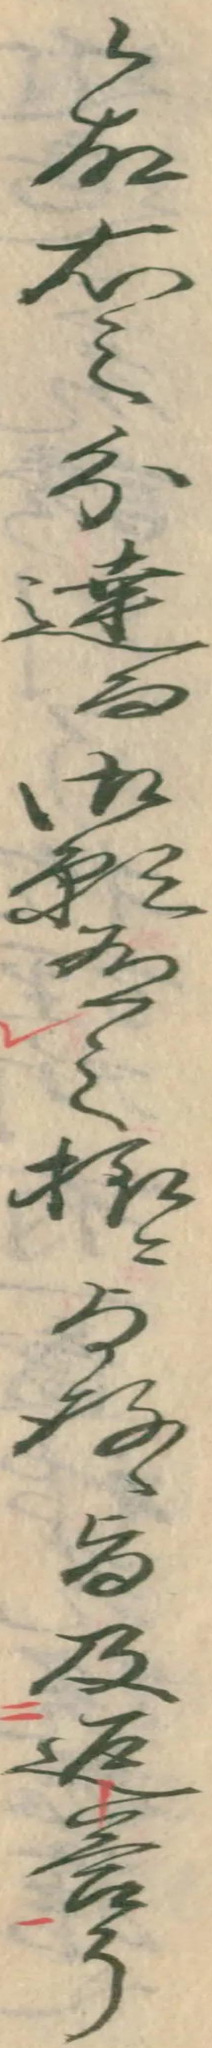候故右之分達而御願有之様ニ与存候旨及返-答了
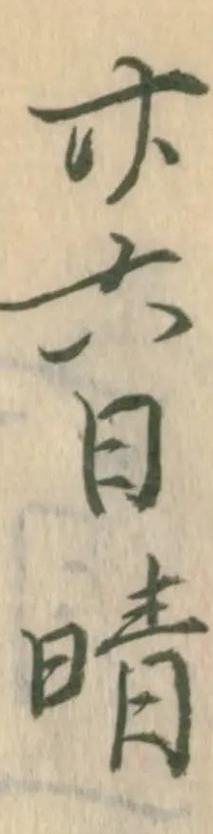廿六日晴
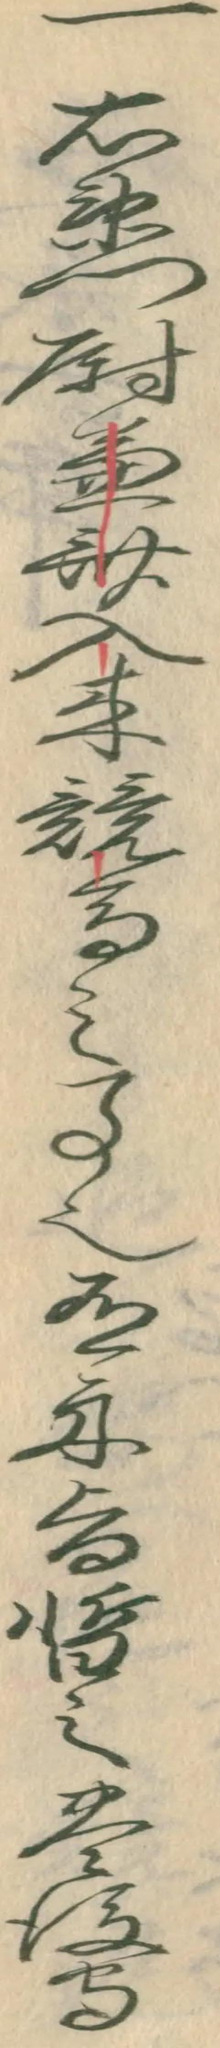一右衛門尉兼斎入-来競-馬之事也有示旨暫之豊後守
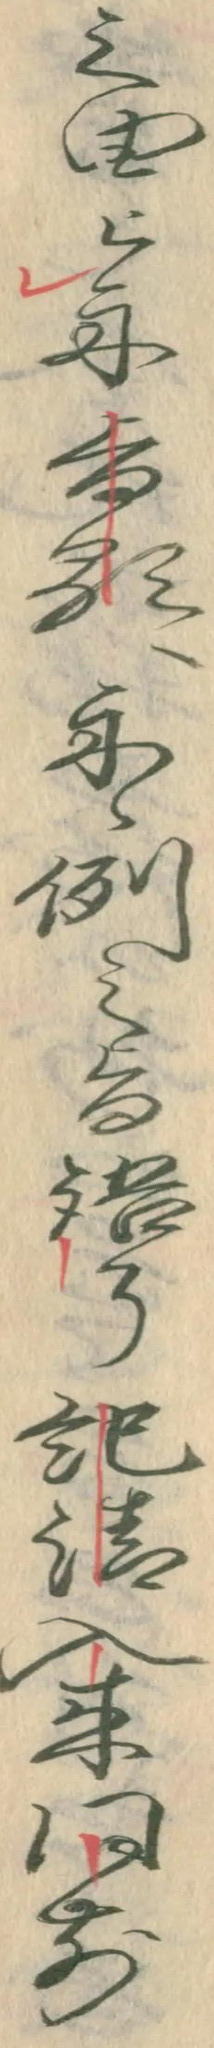之由被示旨顕へ示候例之旨語_了紀清入-来同-前

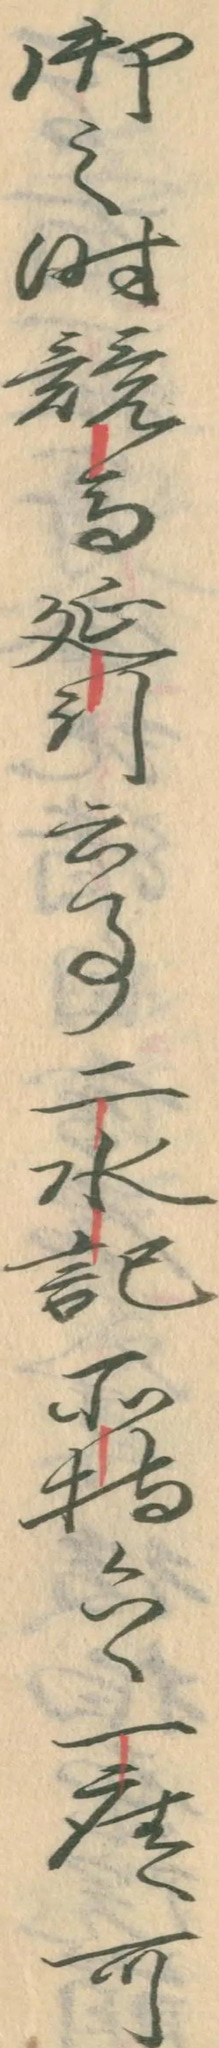御之時競-馬延-引云事二-水-記所-持候ハヽ一-座ヘ可
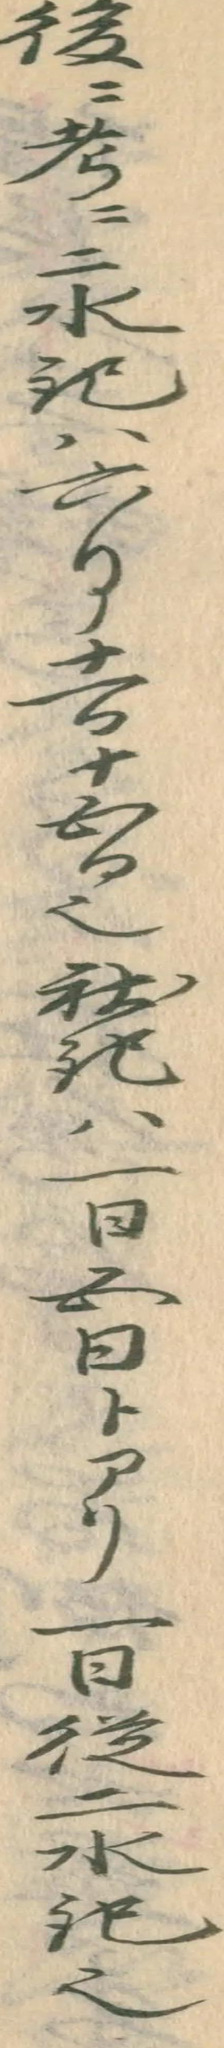後ニ考ニ二水記ハ六月十一日十五日也社記ハ一日五日トアリ一日従二水記也
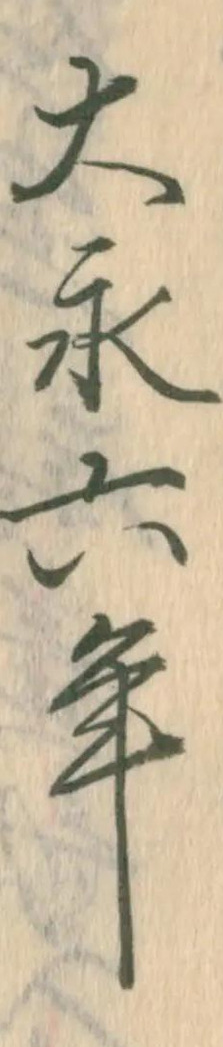大永六年
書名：賀茂社記録. 第16冊
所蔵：国立国会図書館 National Diet Library, JAPAN
